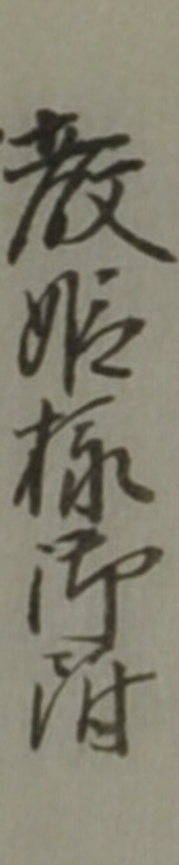教姫様御附
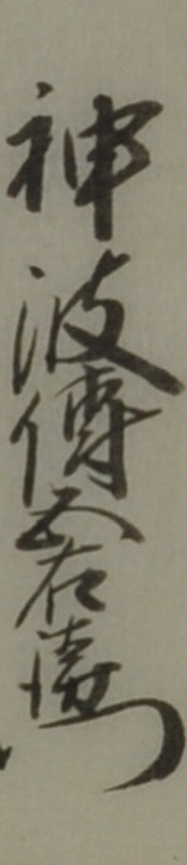神波傳五右衛門
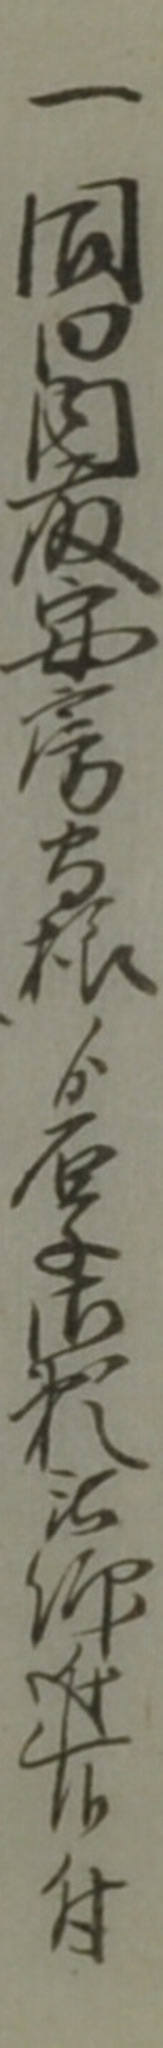一同日内藤安房守様より厚御頼被仰付候付
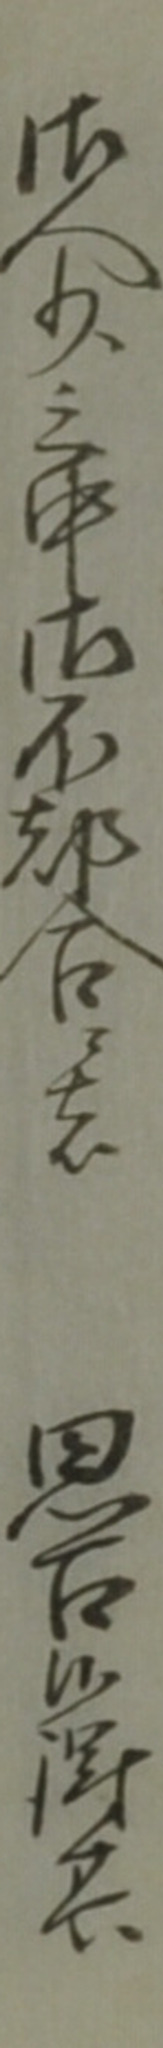御人少之中御不都合に者思召候得共
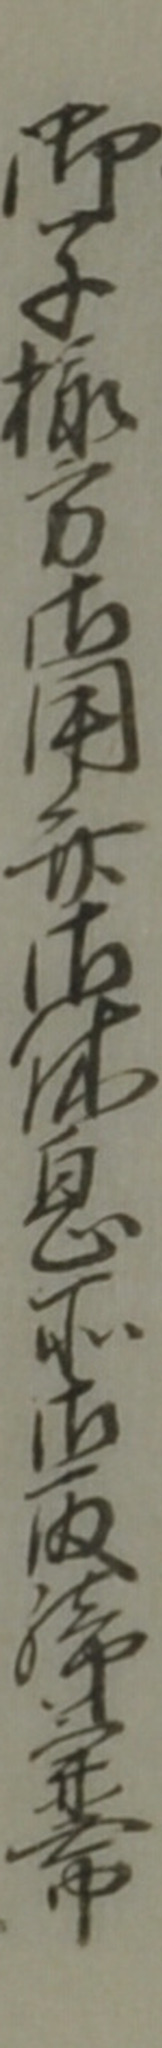御子様方御用弁御休息所御取締兼帯
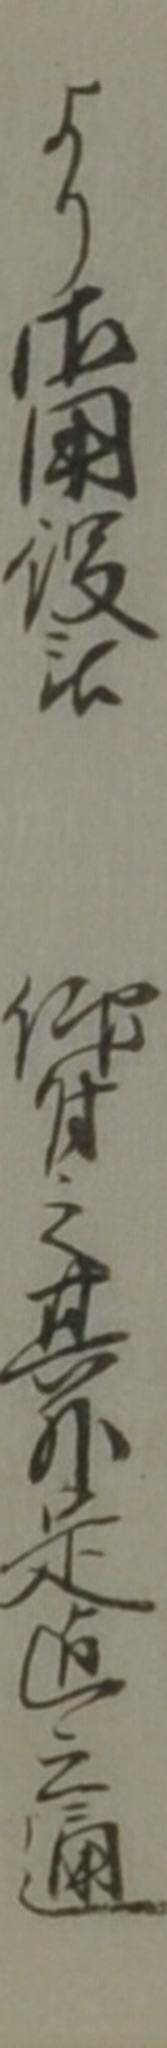より御用役被仰付之其外是迄之通
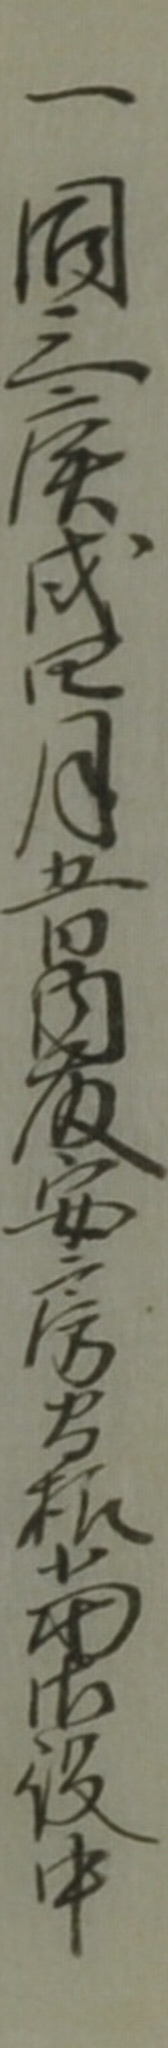一同三庚戌四月五日内藤安房守様当御役中
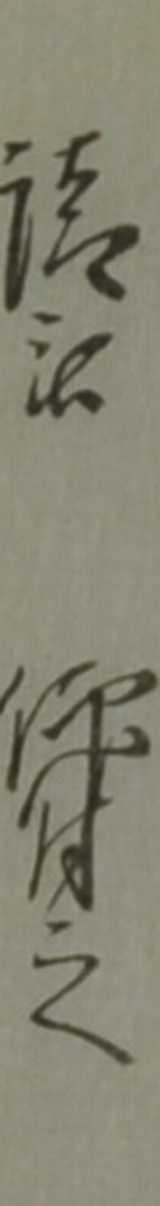請被仰付之
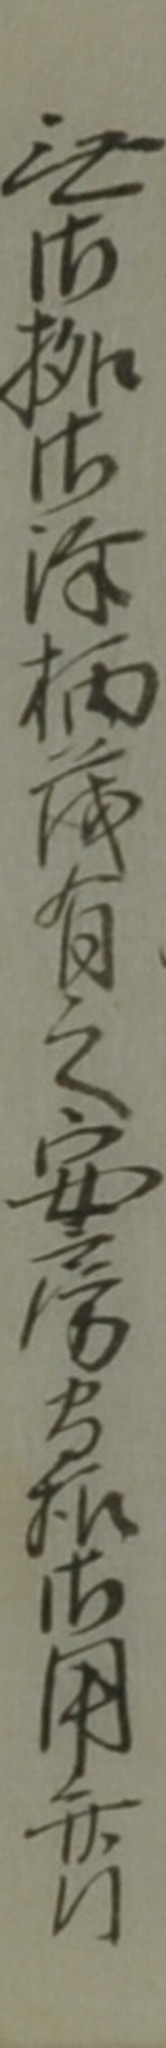無御拠御添柄茂有之安房守様御用弁引
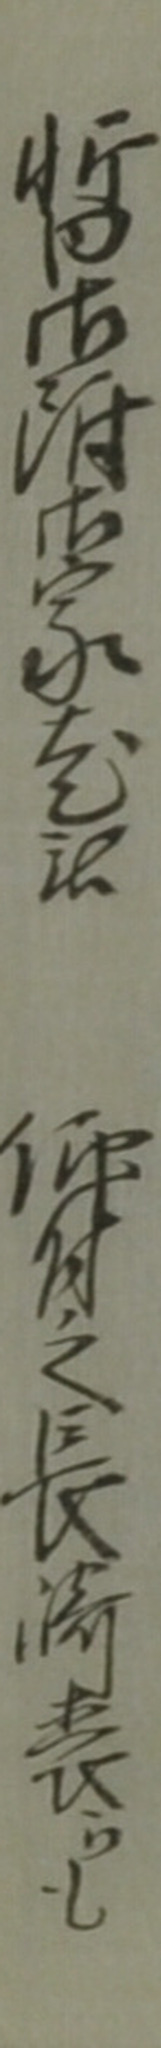暫御附御家老被仰付之長崎表江も
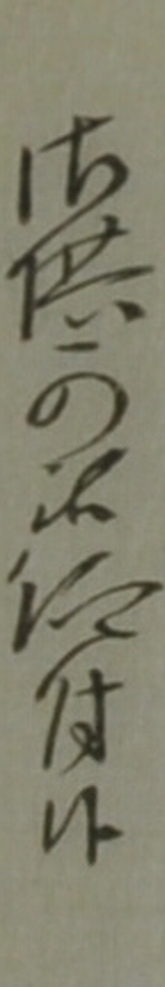御供可被仰付候

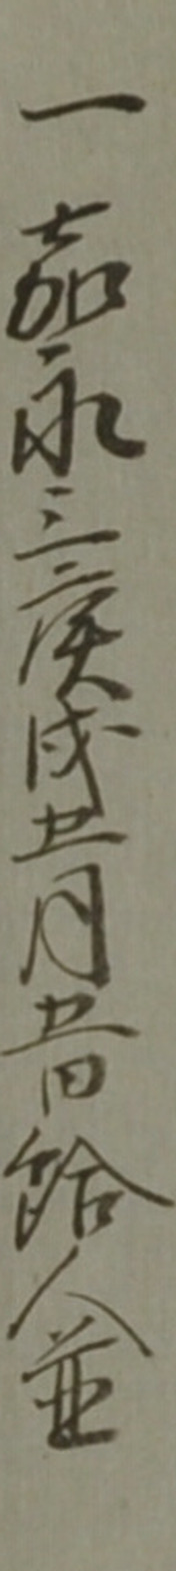一嘉永三庚戌五月五日給人並
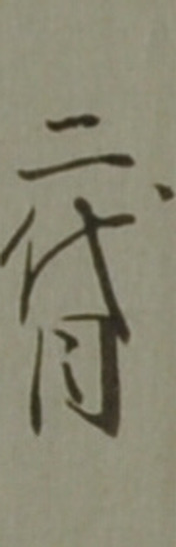二代目
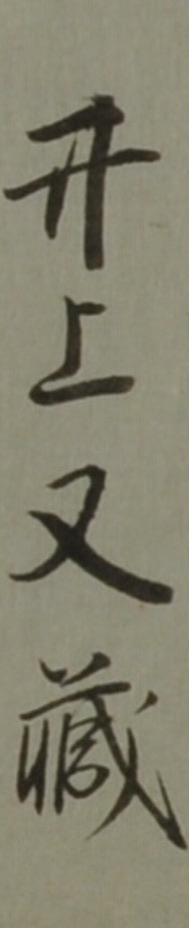井上又蔵
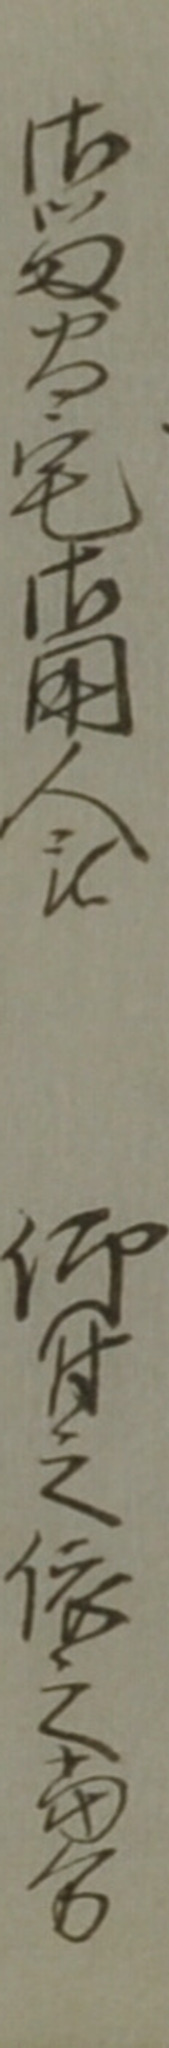御留守宅御用人被仰付也依之当方
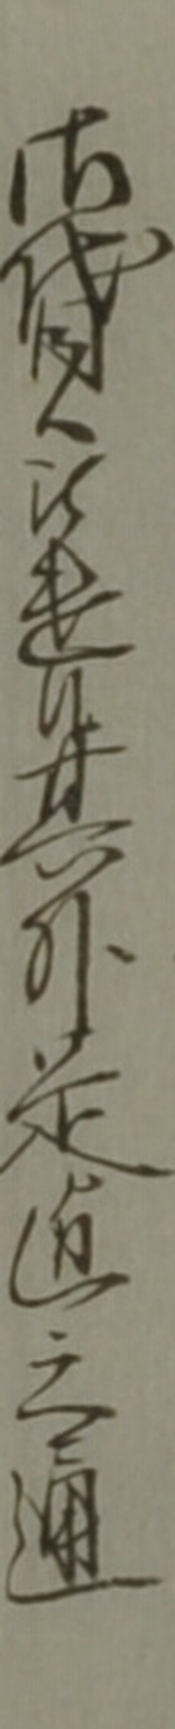御貸被遣候其外是迄之通
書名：諸御役代々録（八）
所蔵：伊那市立高遠町図書館・合同会社AMANE
